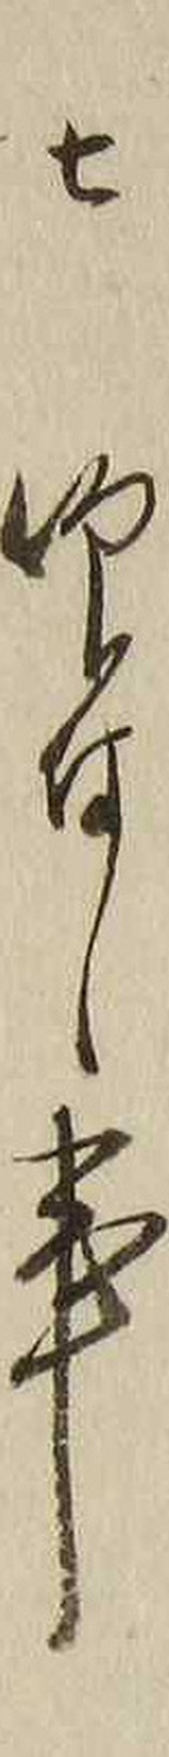被仰付候事
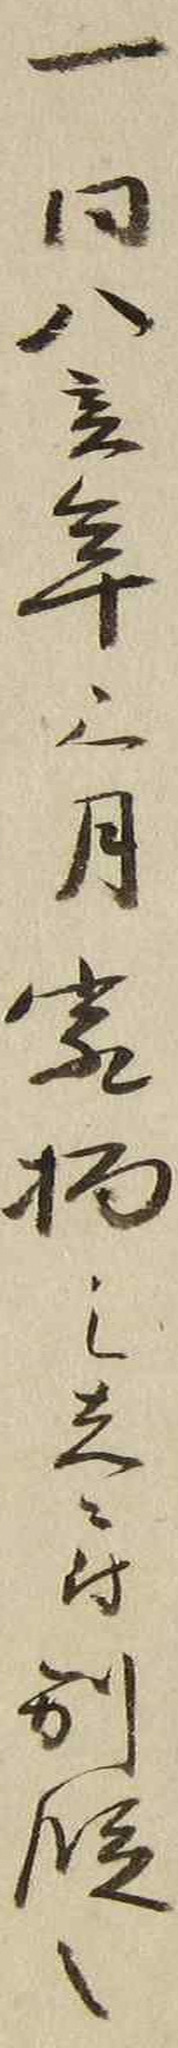一同八亥年三月家柄之者に付別段之
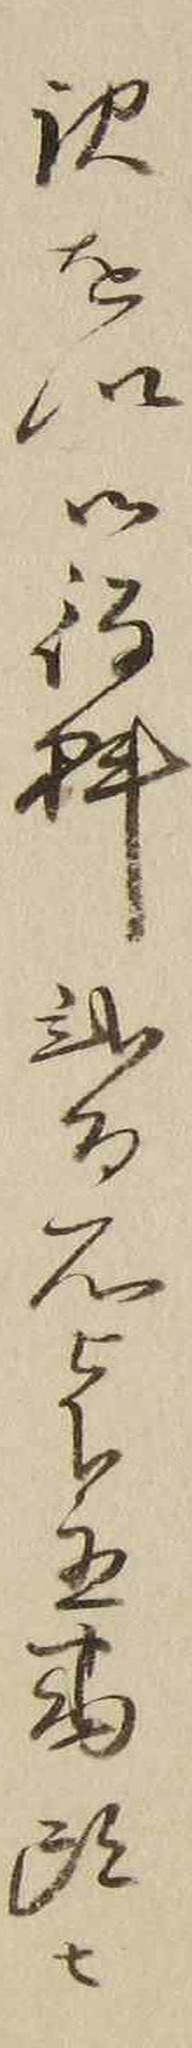訳を以御役料弐百石被下置番頭被
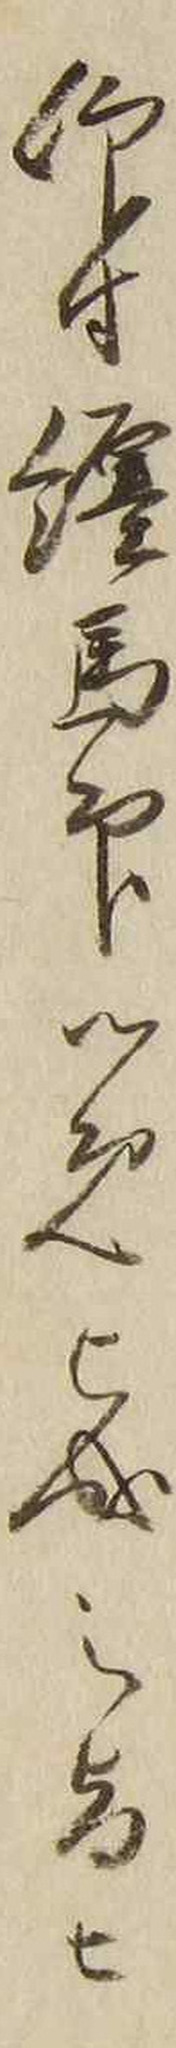仰付纒馬印御免被成候旨被

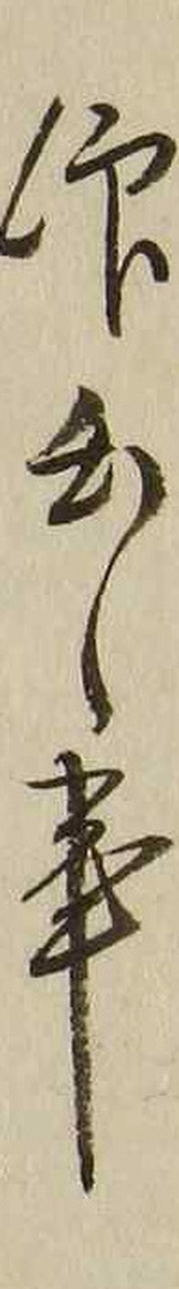仰出候事
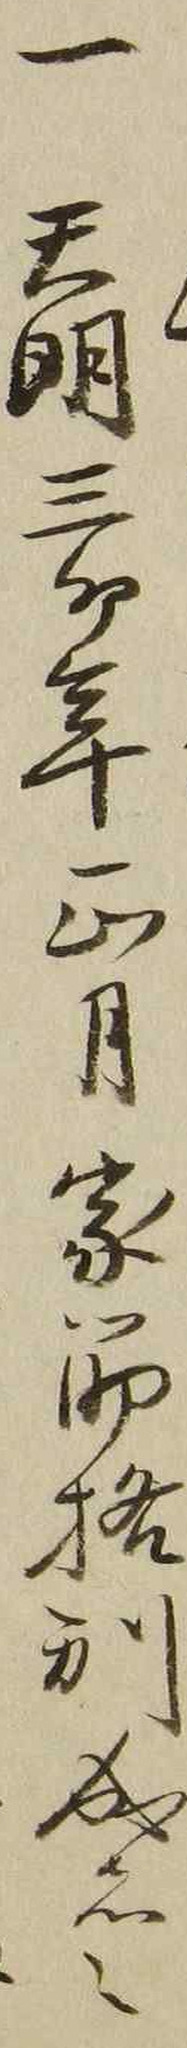一天明三卯年正月家柄格別成者之
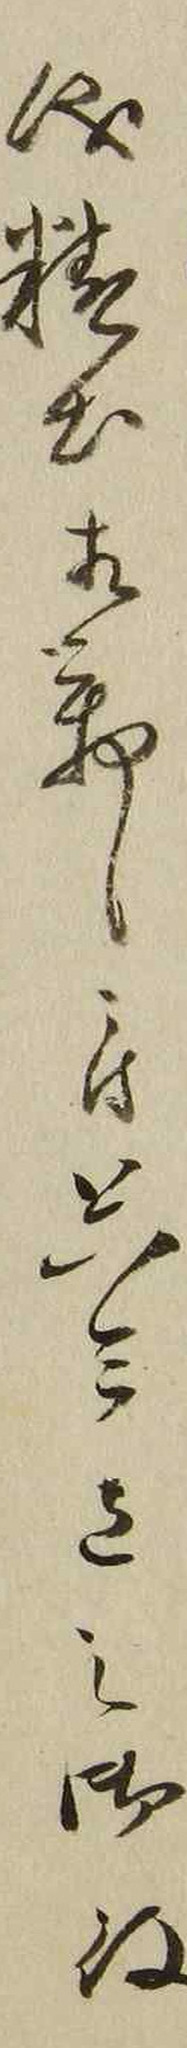儀精出相勤候に付只今迄之御役
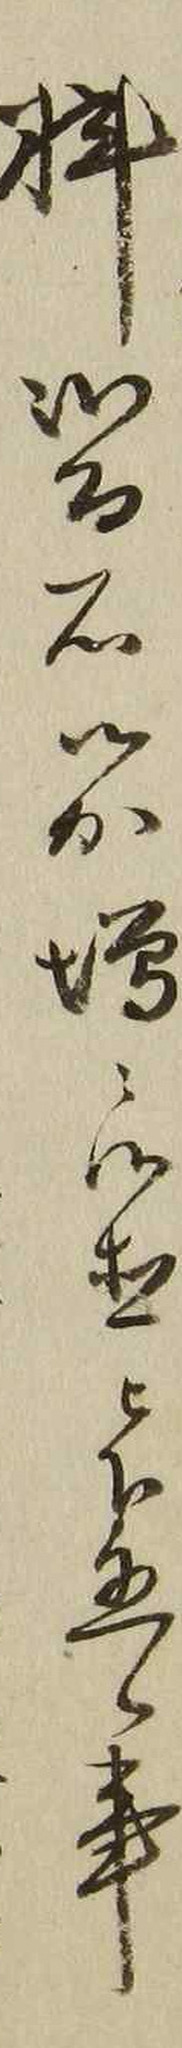料弐百石御加増に御直被下置候事
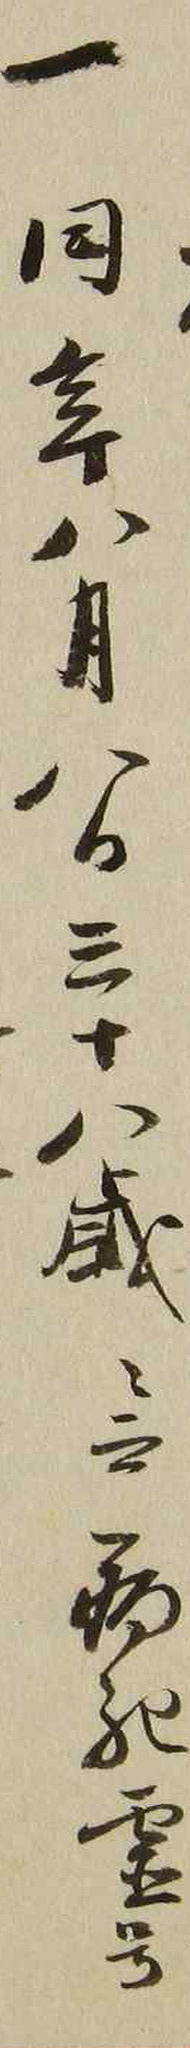一同年八月八日三十八歳に而病死霊号
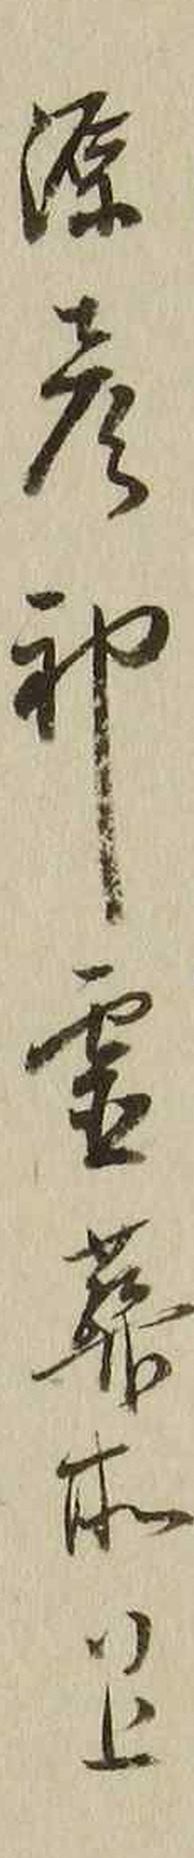源彦神霊葬所堂上
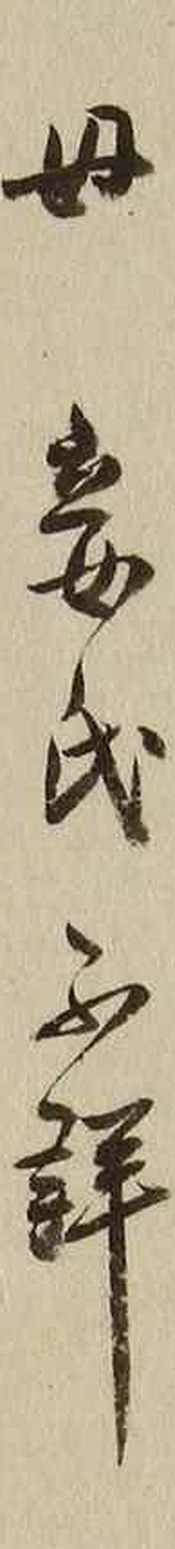母妾氏不詳
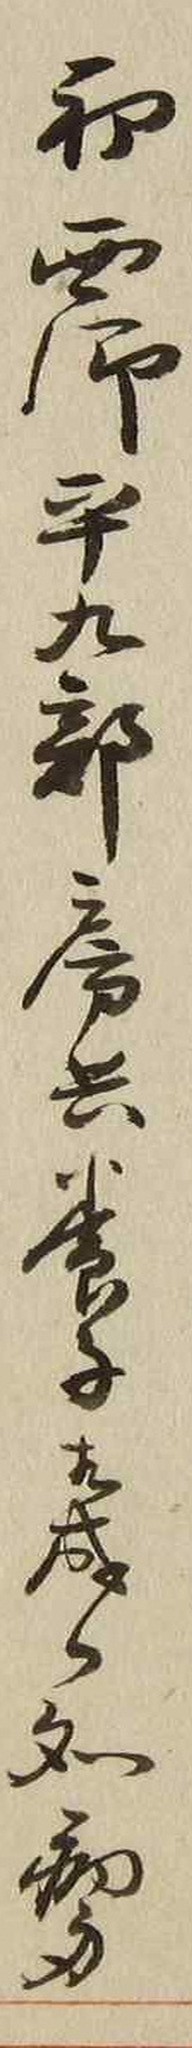初西郷平九郎房共養子相成候処病身
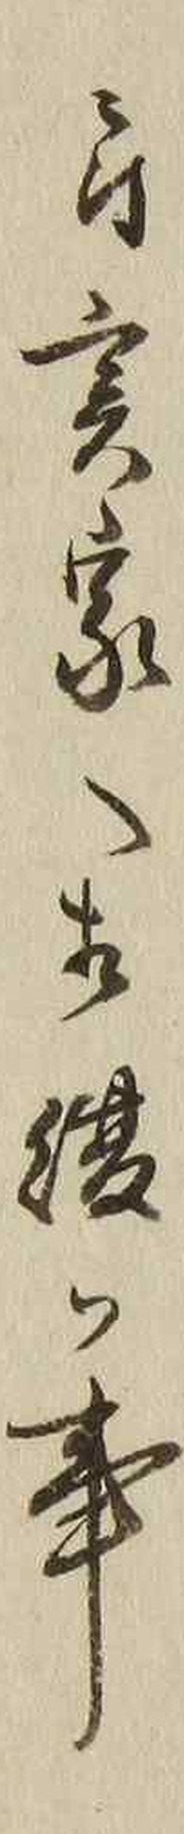に付実家へ相復候事
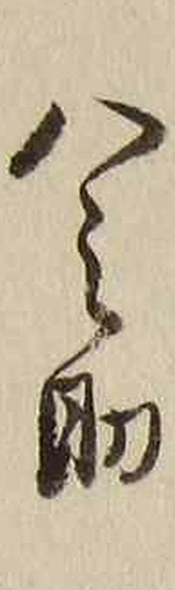八之助
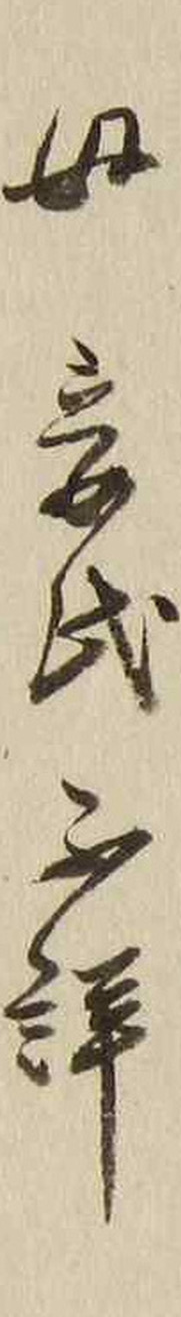母妾氏不詳

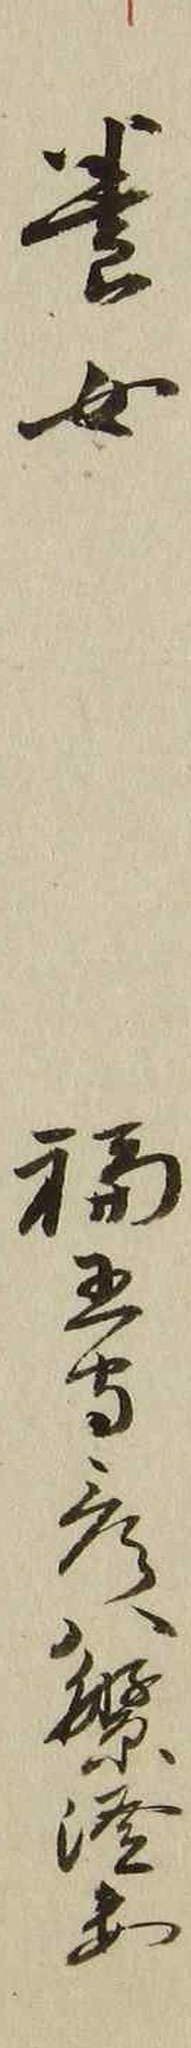養女福王寺彦八繁澄妻
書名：諸士系譜　巻之269　さ之部1
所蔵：会津若松市立会津図書館
